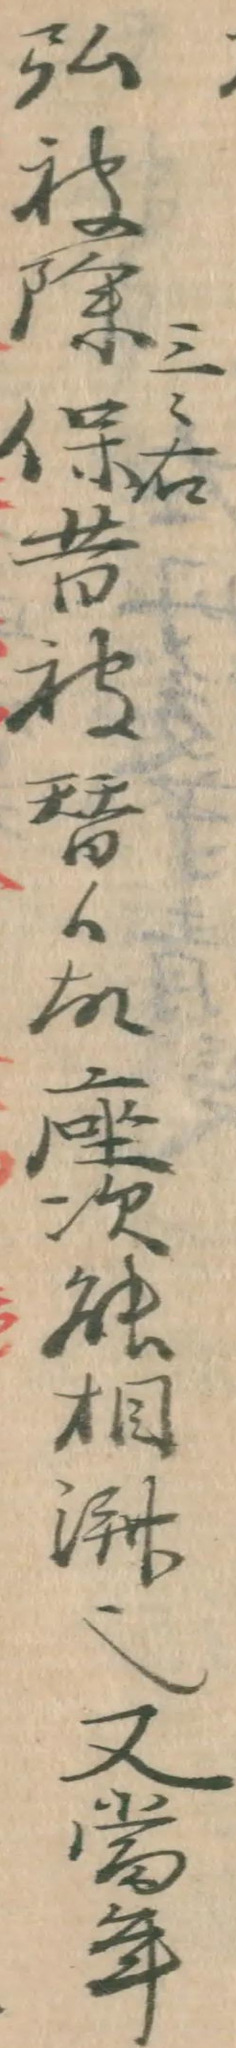弘被除保昔被替候故座次能相済也又当年
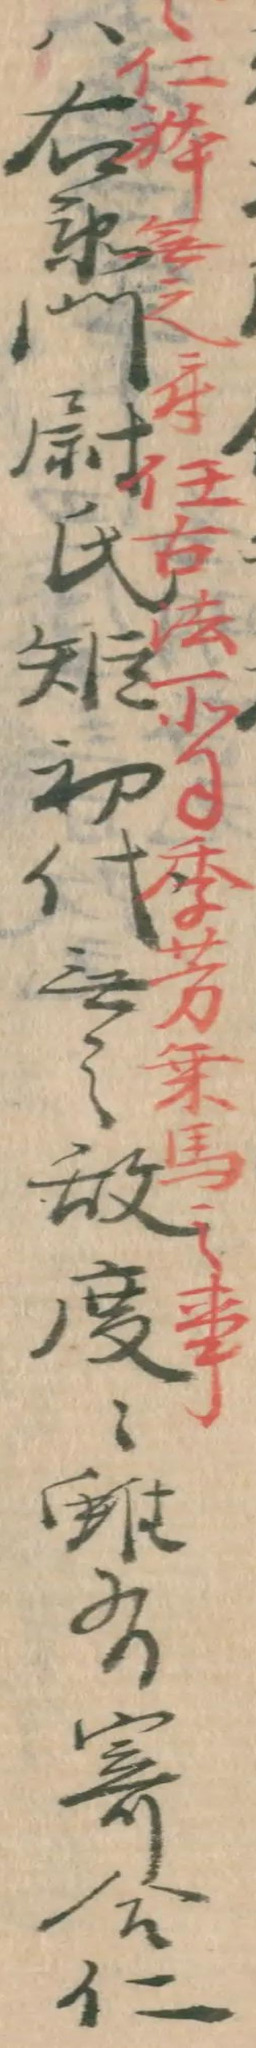ハ右衛門尉氏矩初代無之故度々雖有寄合仁
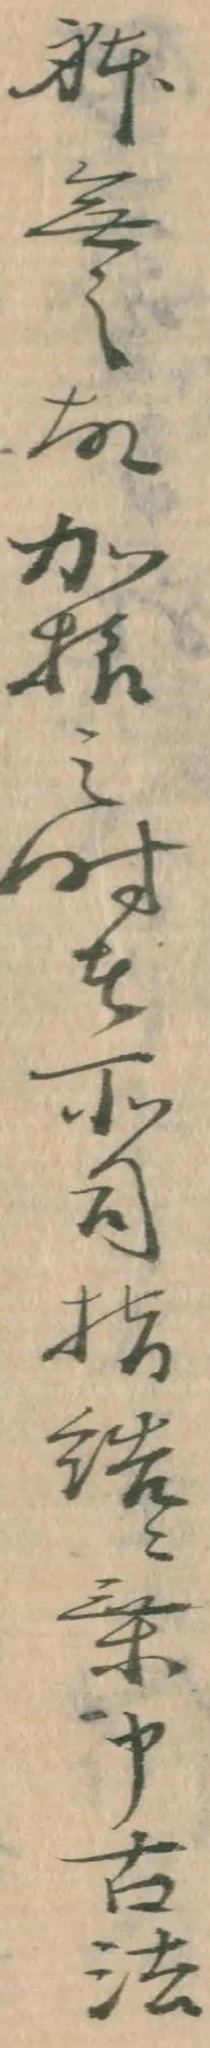躰無之故加様之時者所司指詰ニ乗申古法
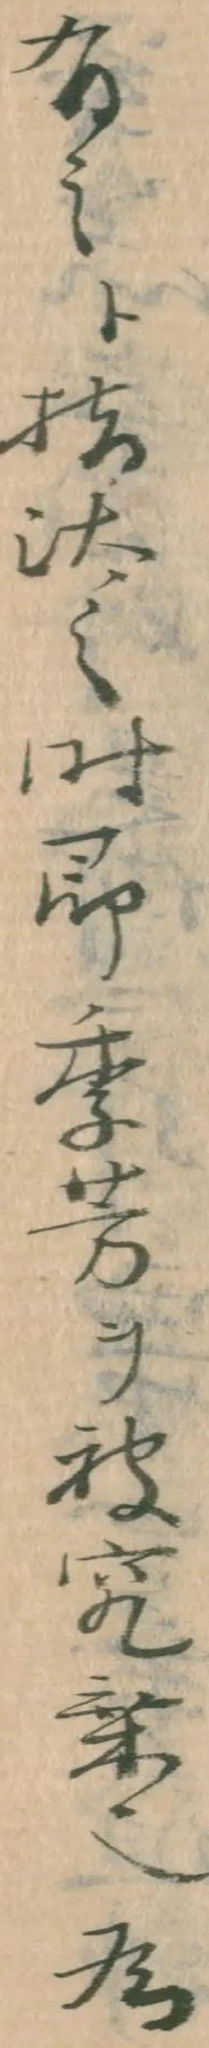有之ト指汰之時節季芳ヲ被究乗也為
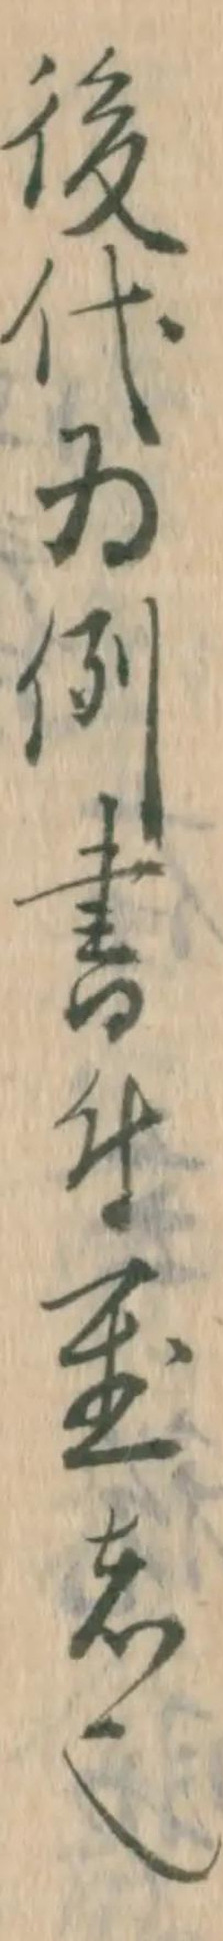後代為例書付置者也
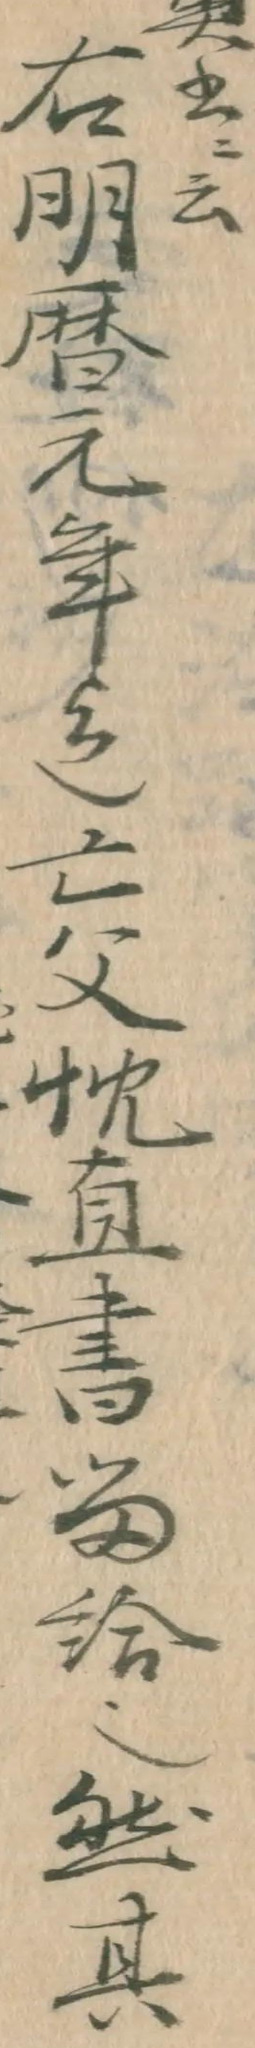右明暦元年迄亡父悦直書留給也然其
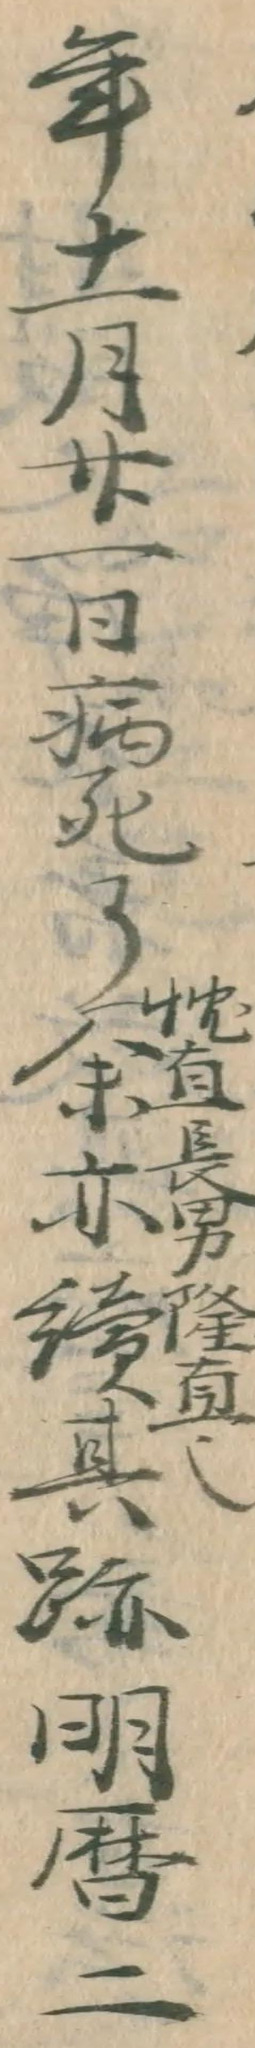年十一月廿一日病死了余亦続其跡明暦二
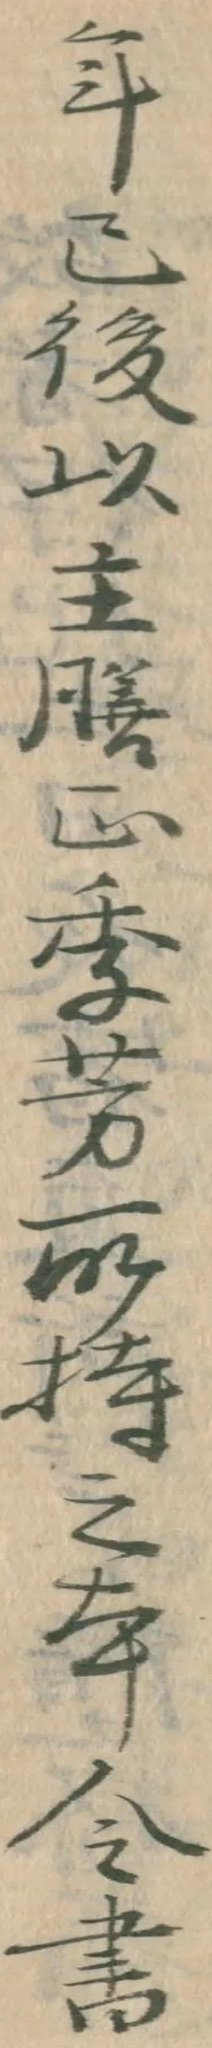年已後以主膳正季芳所持之本令書
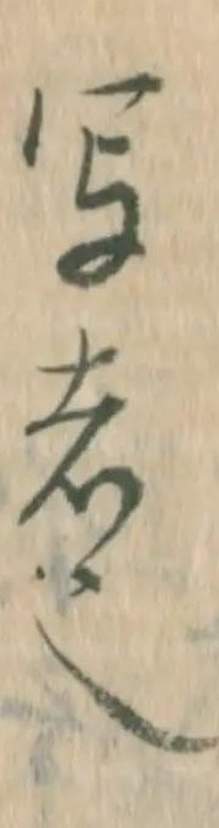写者也

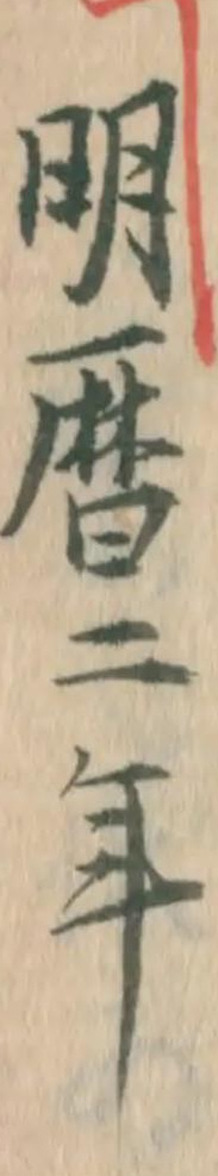明暦二年
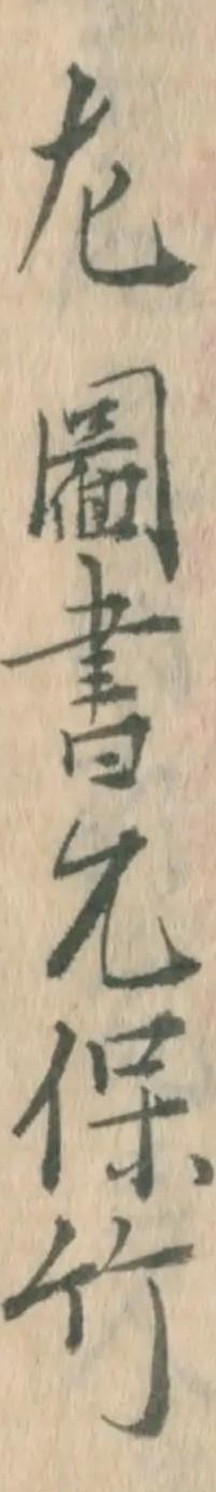左図書允保竹
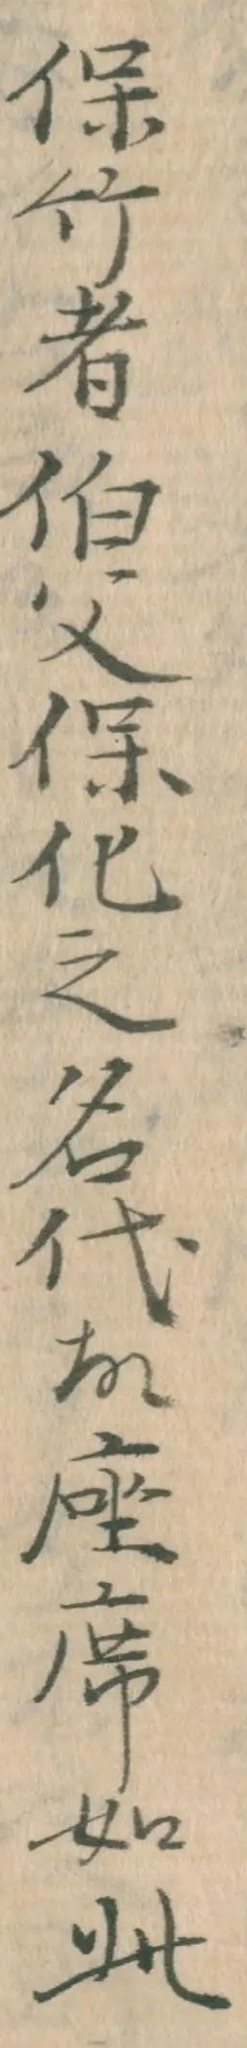保竹者伯父保化之名代故座席如此
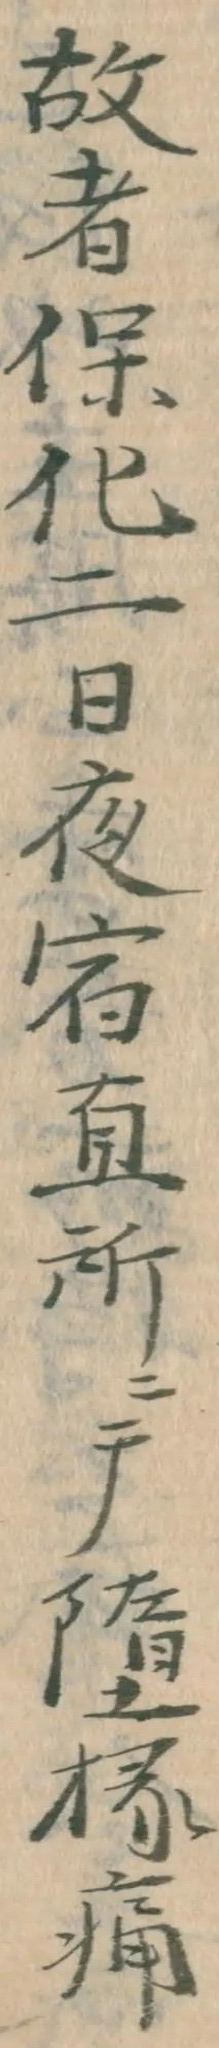故者保化二日夜宿直所ニテ堕椽痛
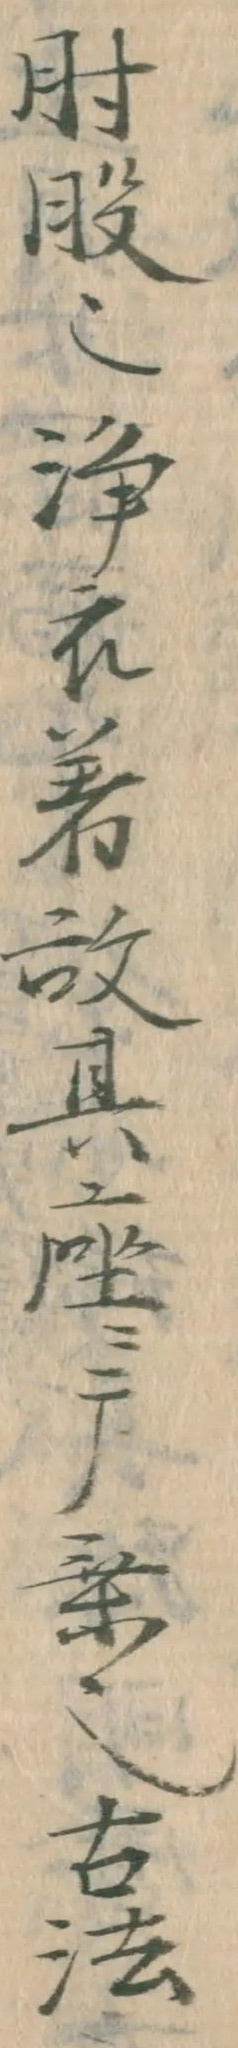肘股也浄衣着故其座ニテ乗也古法
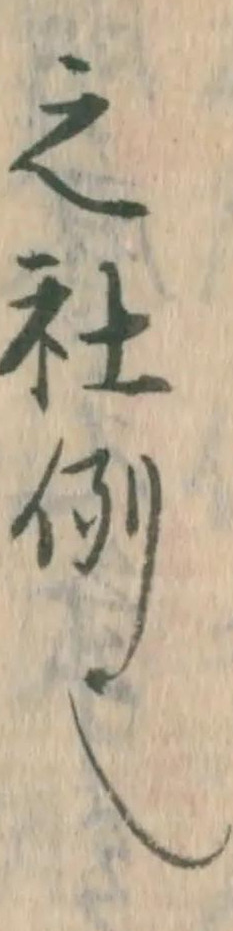之社例也
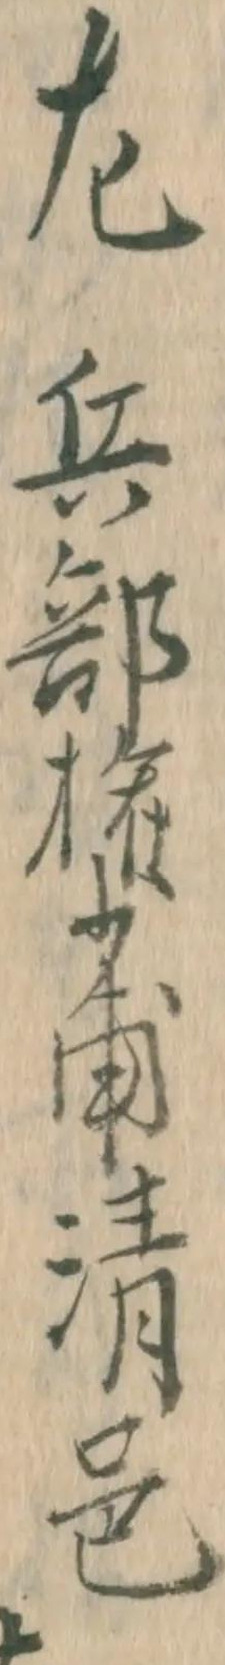左兵部権少輔清邑
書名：賀茂社記録. 第10冊
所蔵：国立国会図書館 National Diet Library, JAPAN
